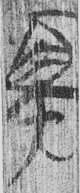○（衡）
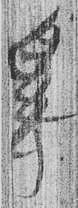○（奚）
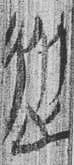從（縱）
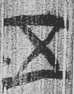五
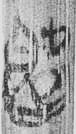既（氣）
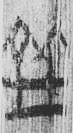竝
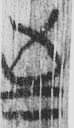至
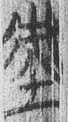○（吾）
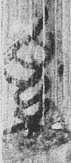○（奚）
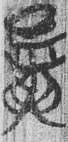異
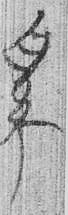○（奚）
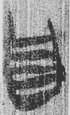同
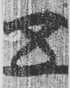五
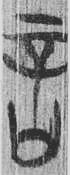音
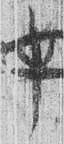才
